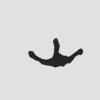山
